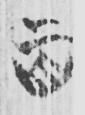百
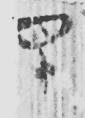{四十}
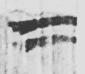二
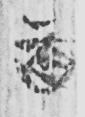百
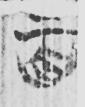百
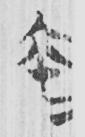六十=
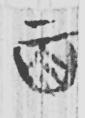百
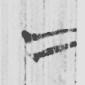二
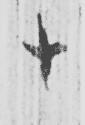十
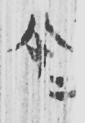八十=
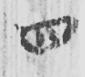四
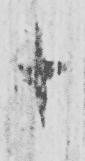十
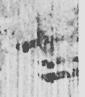廿=
